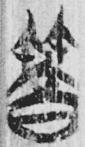○（孰）
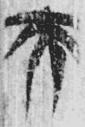天
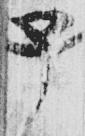子
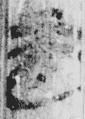而
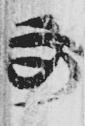可
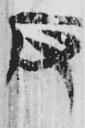反
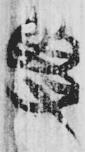受（紂）
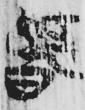○（聞）
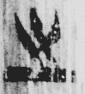之
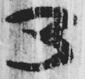乃
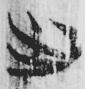出
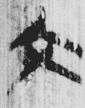文
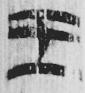王
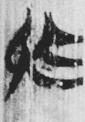於
